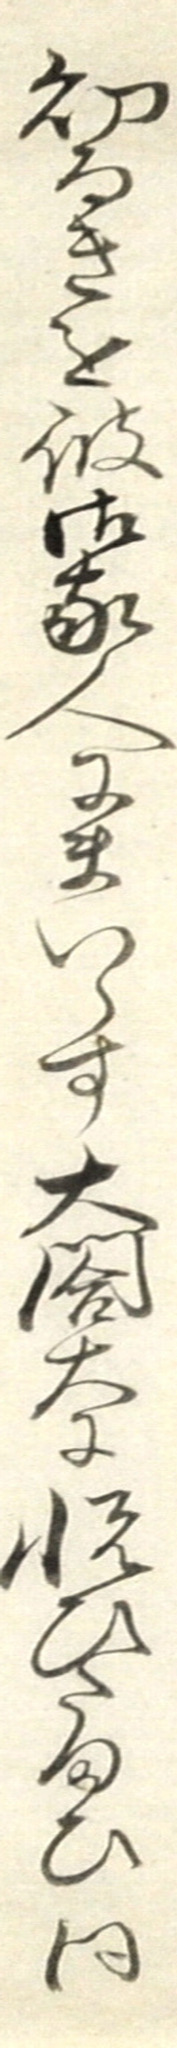幼なきを彼御家人にまいらす太閤大に悦ひたまひ同
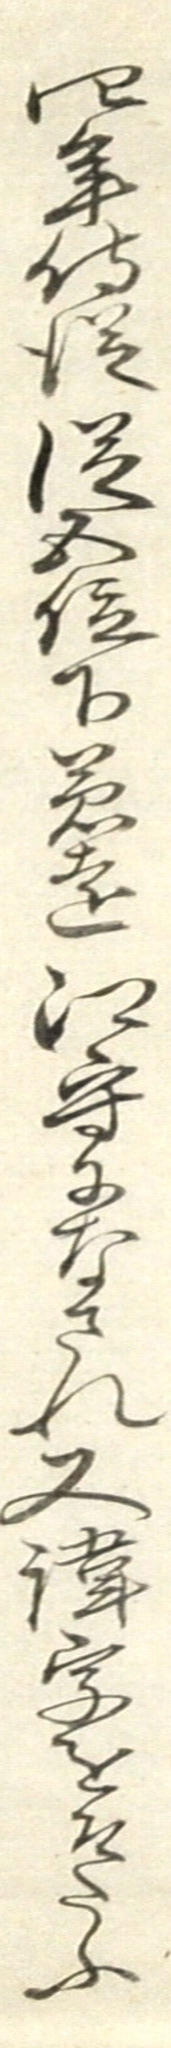四年侍従従五位下兼遠江守になされ又諱字をそたふ
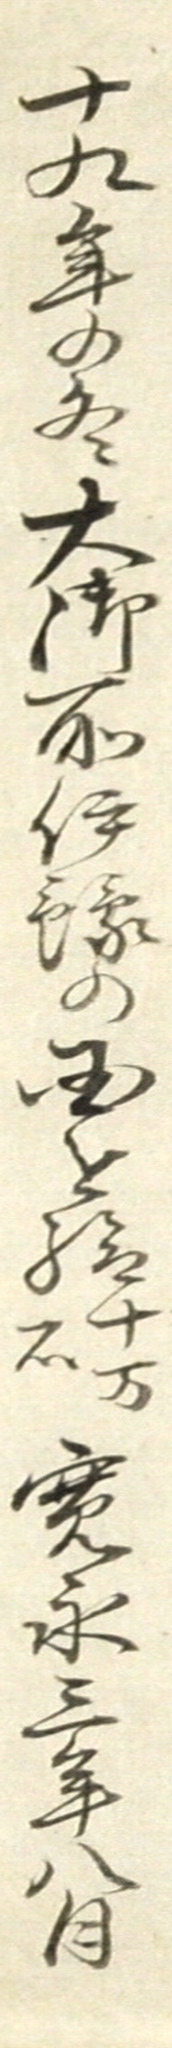十九年の冬大御所伊予の国を給十万石寛永三年八月
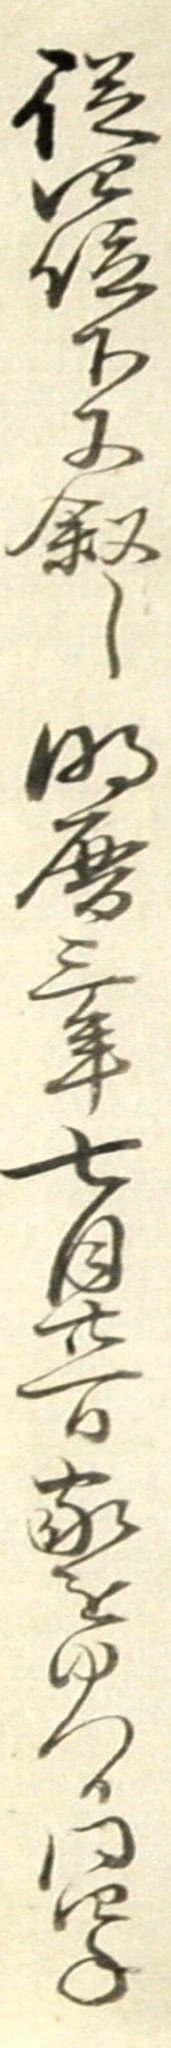従四位下に叙し明暦三年七月廿一日家をゆつる同四年
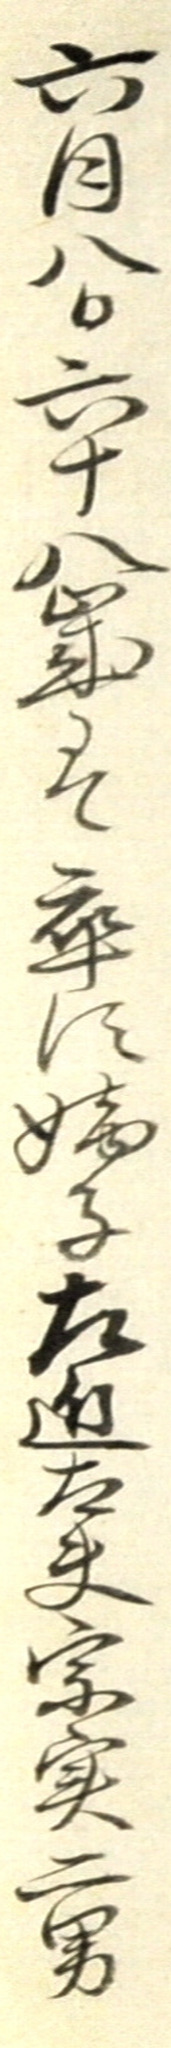六月八日六十八歳にて卒す嫡子左近大夫宗実二男

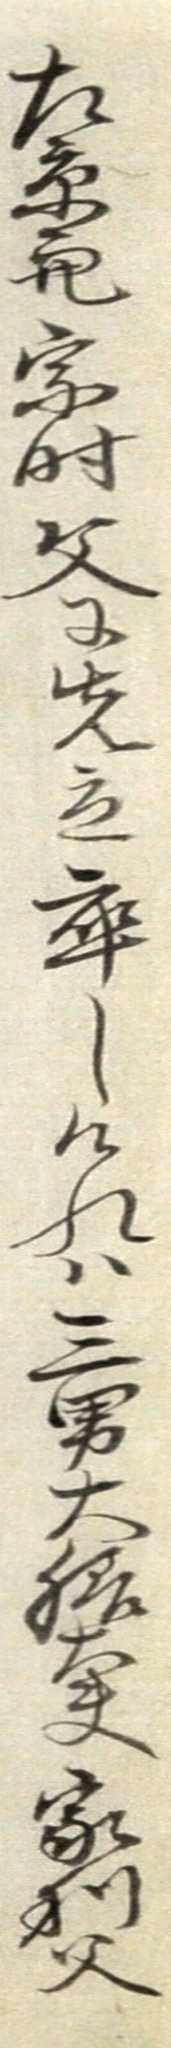左京亮宗時父に先立卒しけれは三男大膳大夫家利父
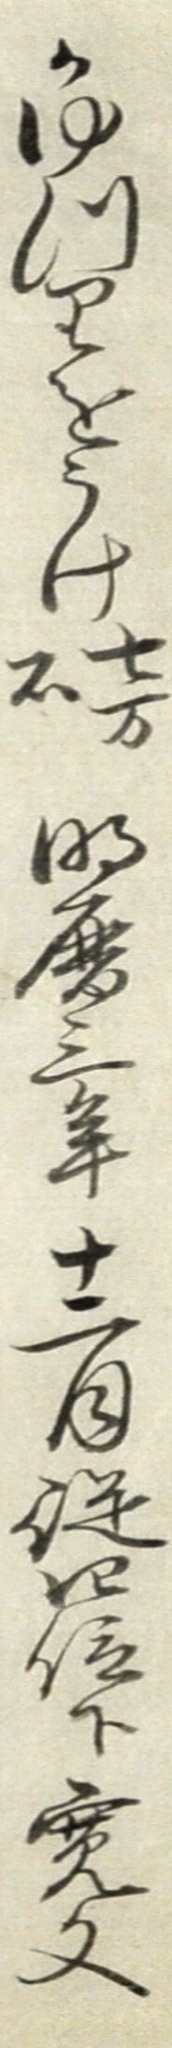かゆつりをうけ七万石明暦三年十二月従四位下寛文
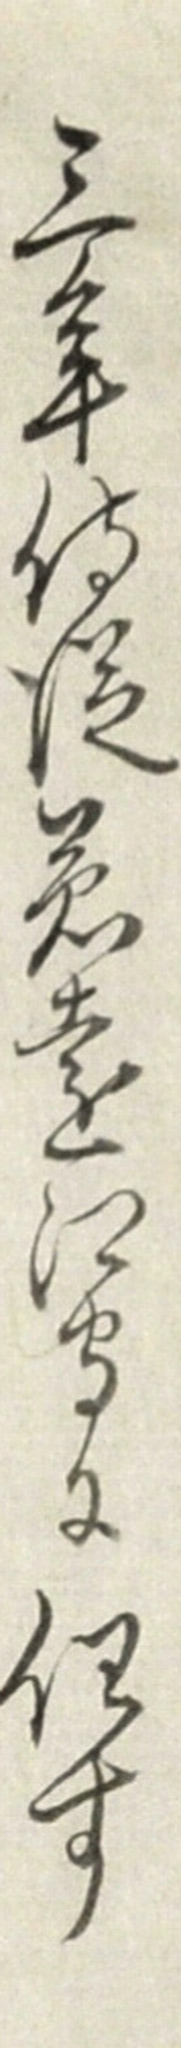三年侍従兼遠江守に任す
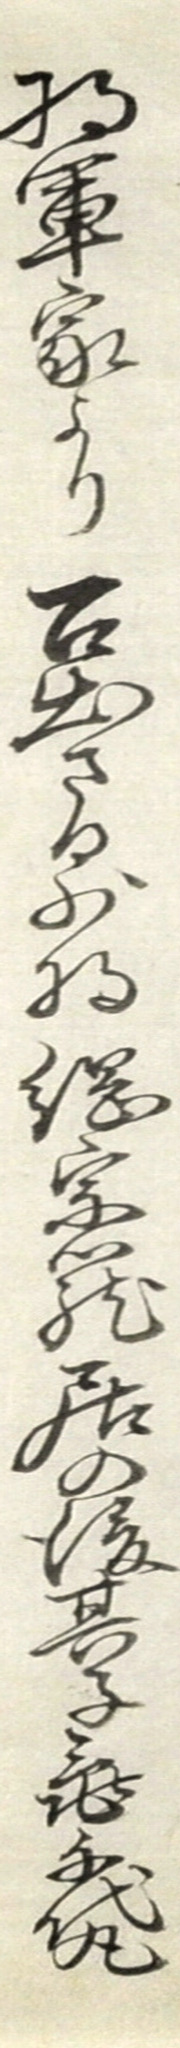将軍家より召出さる少将綱宗籠居の後其子亀千代丸
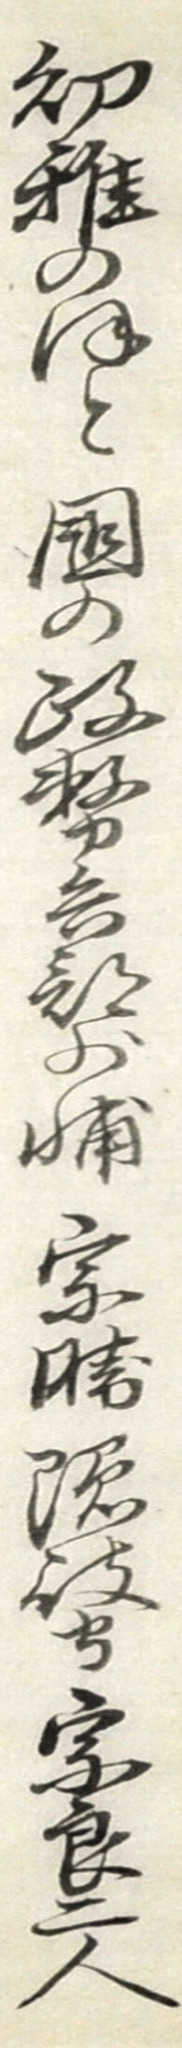幼稚のほと国の政務兵部少輔宗勝隠岐守宗良二人
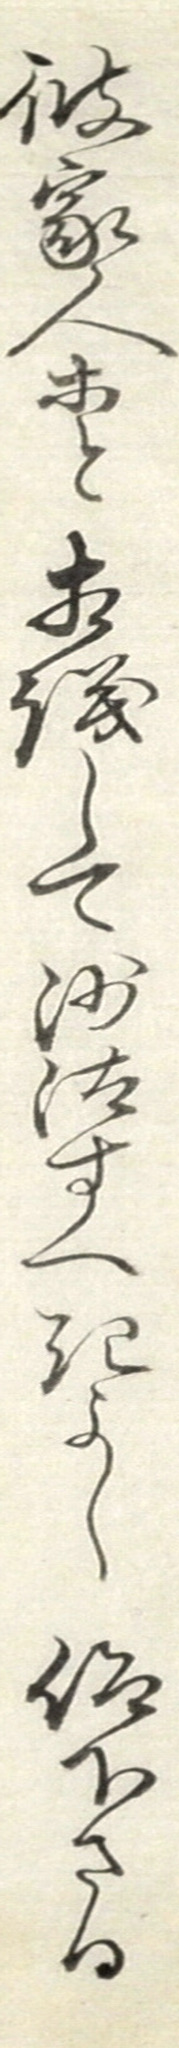彼家人等と相議して沙汰すへきよし仰下さる
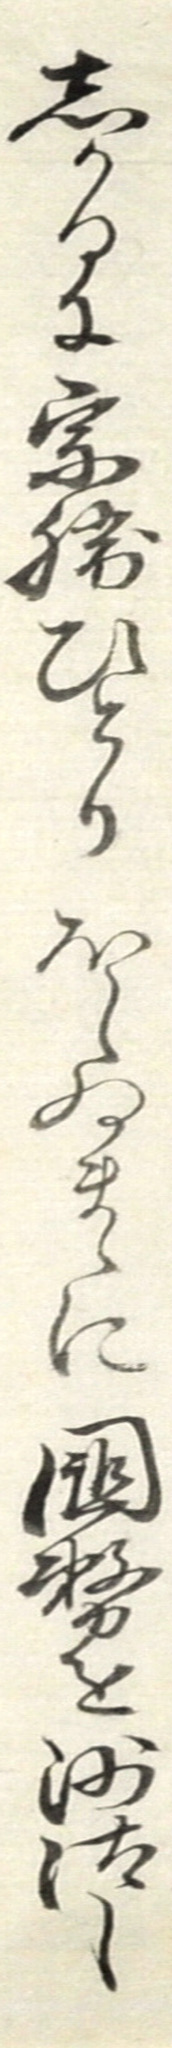しかるに宗勝ひとりほしゐまゝに国務を沙汰し
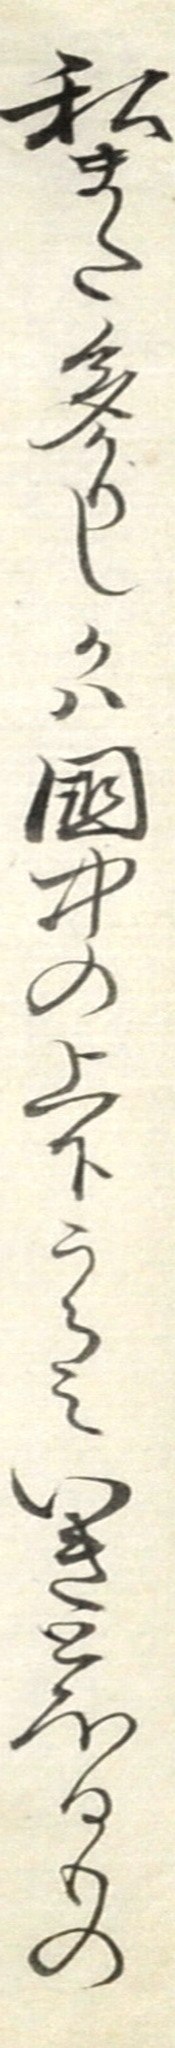私また多かりしかは国中の上下うらみいきとほるもの
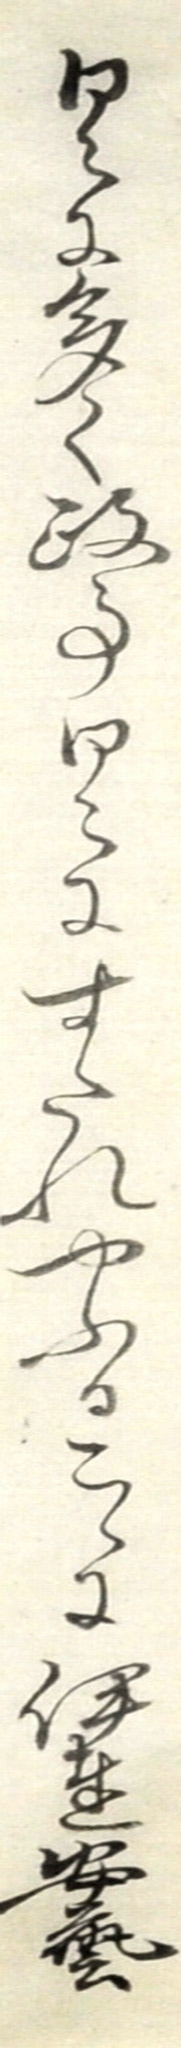日々に多く政事日々にすたれやふるこゝに伊達安芸
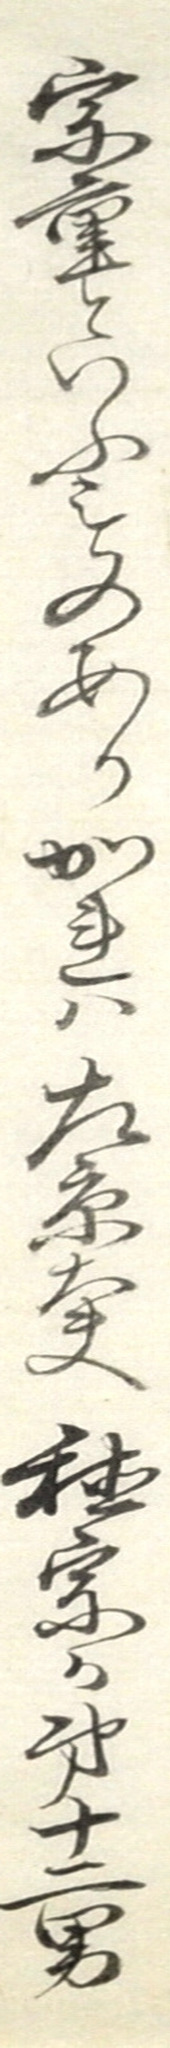宗重といふものありかれは左京大夫稙宗か第十二男
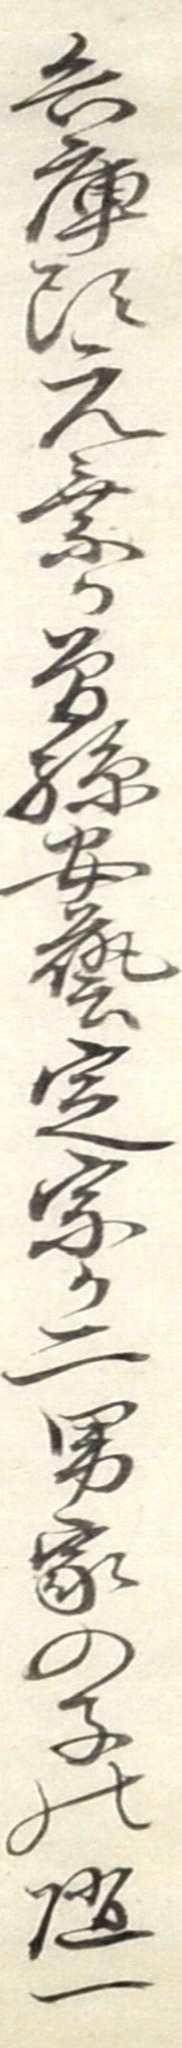兵庫頭元乗か曽孫安芸定宗か二男家の子の随一
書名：藩翰譜（七・下）
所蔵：伊那市立高遠町図書館・合同会社AMANE
